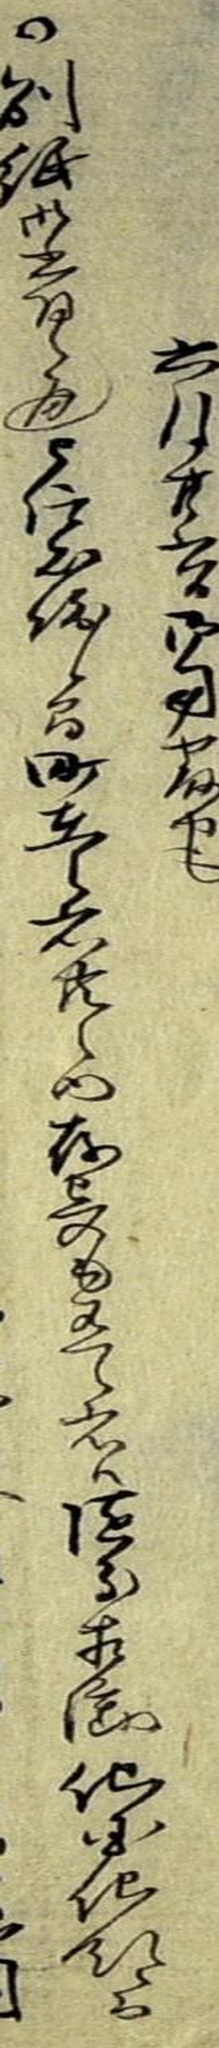〇別紙御書付之通被仰出儀候間町在之者共之内存寄も有之者ハ随分相働他国他領ニ而
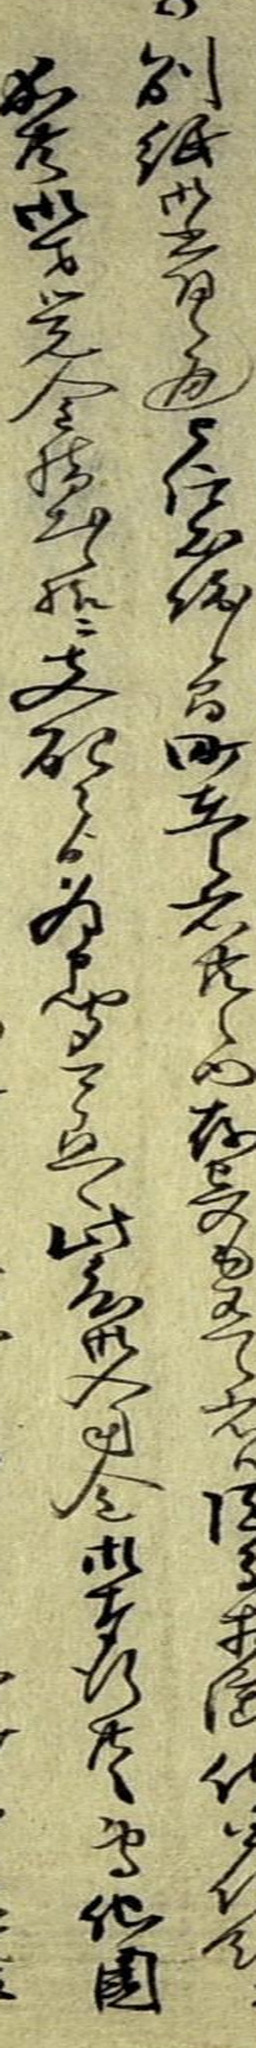成共御才覚金指出候様ニ支配々ゟ為申聞可置候此度御入用金御奉行共専他国
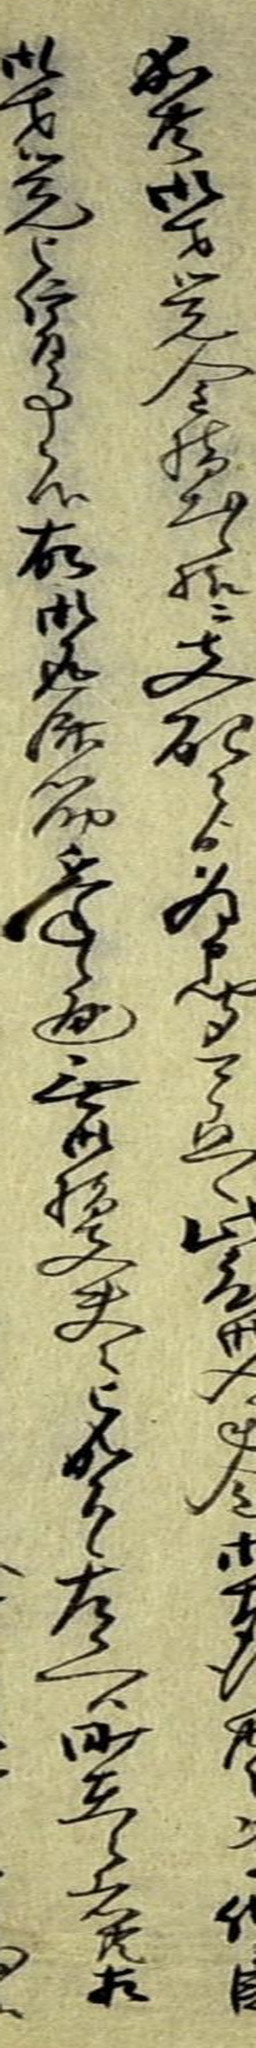御才覚被仰付事ニ候故御返済筋近年之通無御指支夫々被成下候左候ヘハ町在之者共相
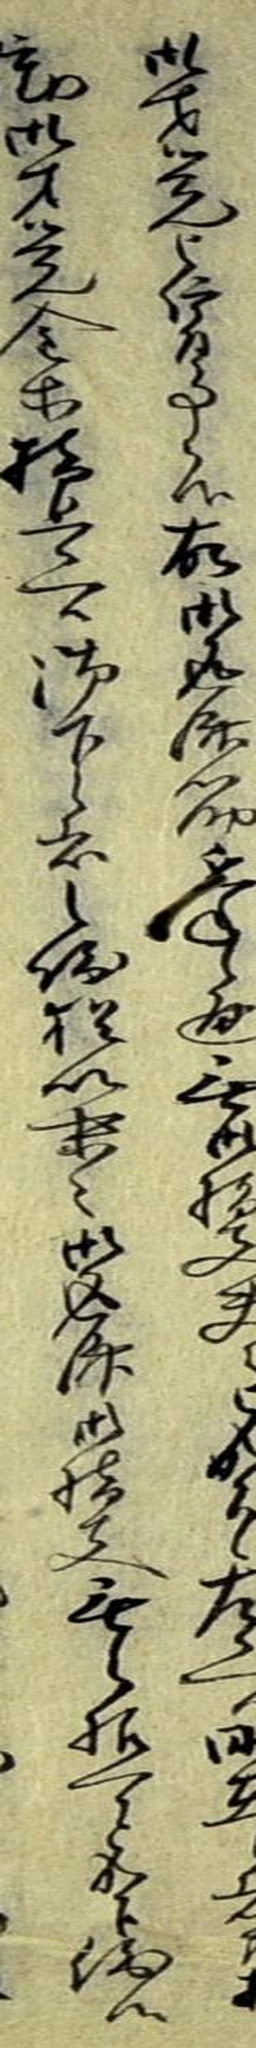働御才覚金等指上候ヘハ御下之者之儀猶以末々御返済御指支無之様可被成下儀候
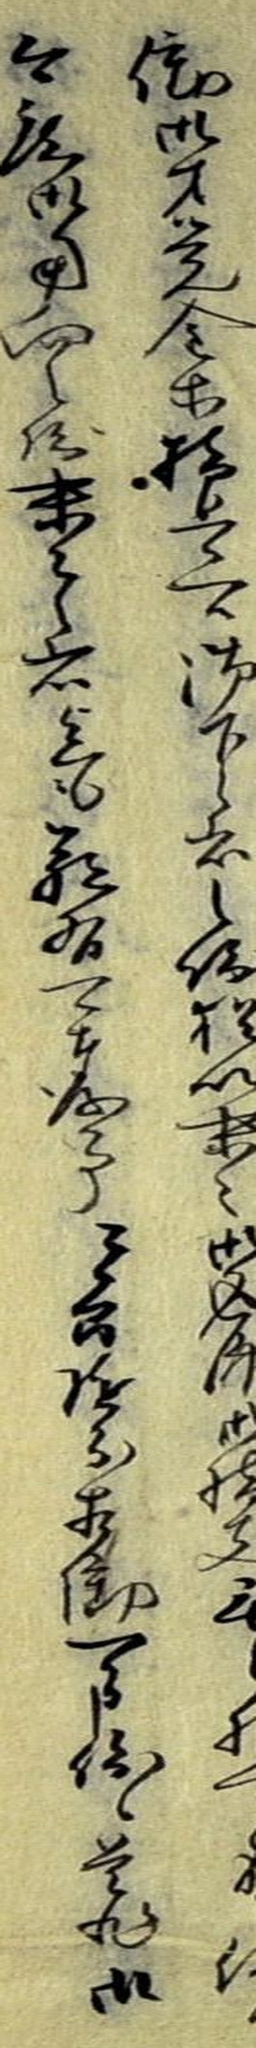今度御用向之儀末々之者迄も難有可奉存事ニ候間随分相働可申儀候是非御

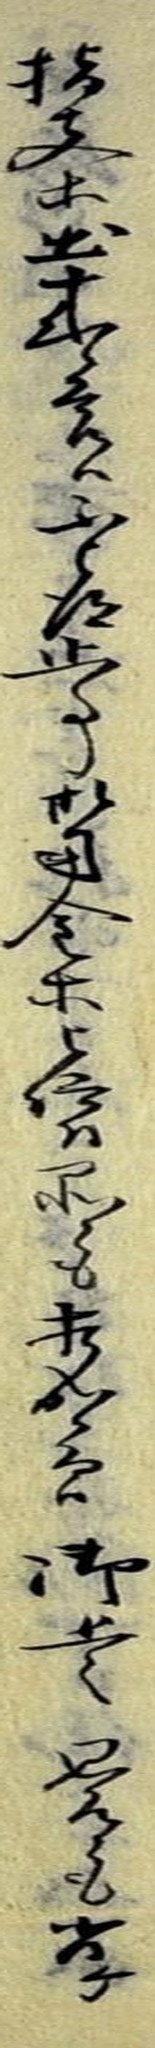指支等出来候節ハ不被得止事御用金等被仰付品ニも相成候而ハ御上之思召とも背ケ
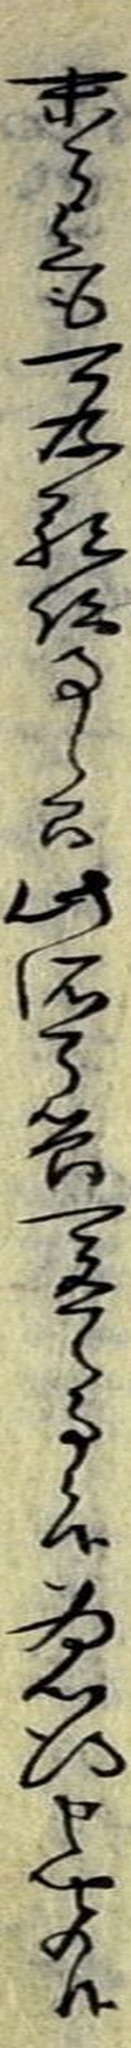末々迄も可及難儀事候間此所了簡可有之事ニ候為心得申聞候
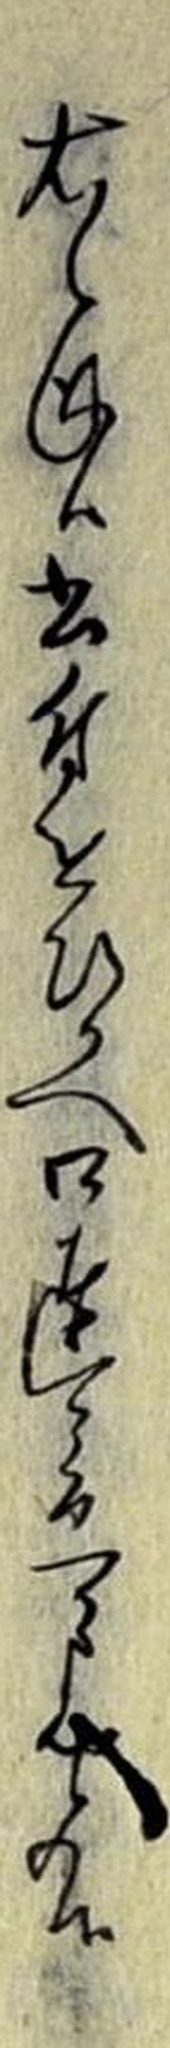右之趣ハ書付をひかへ口達ニ而可申聞候
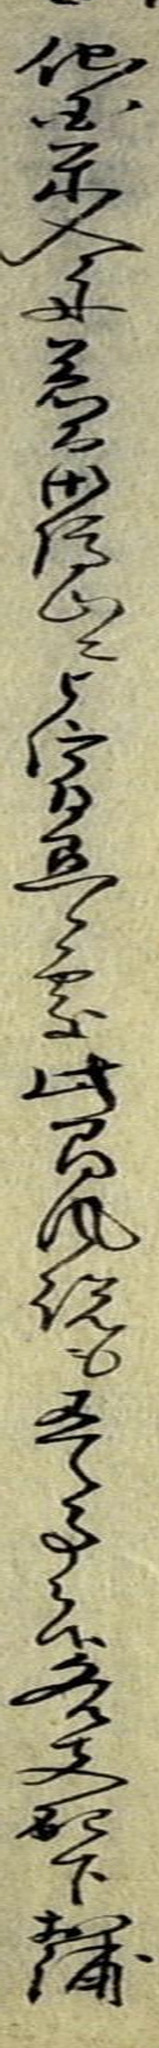〇他国米入舟兼而御停止ニ被仰付置候処此間風説も有之事ニ候各支配下於浦
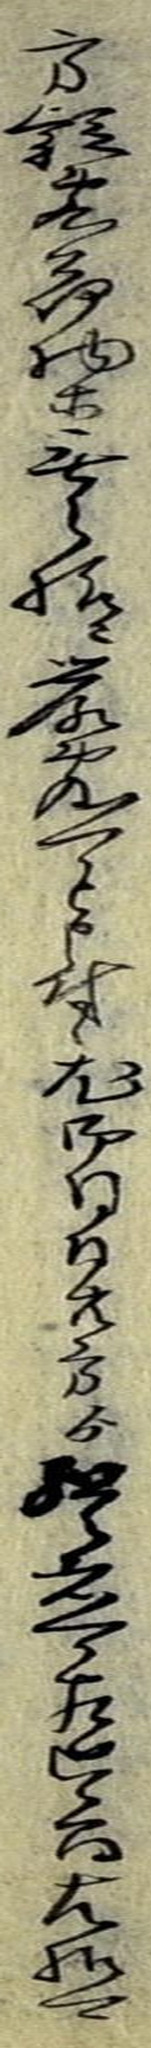方疑敷荷物等無之様ニ厳敷可被申付候尤御目付共方ゟ組之者可相廻候間左様可
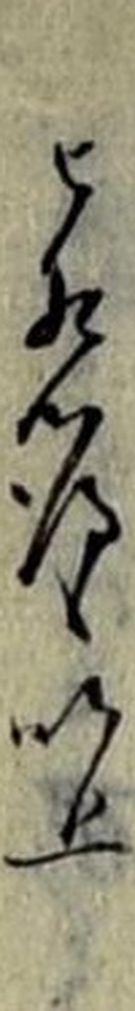被相心得候以上
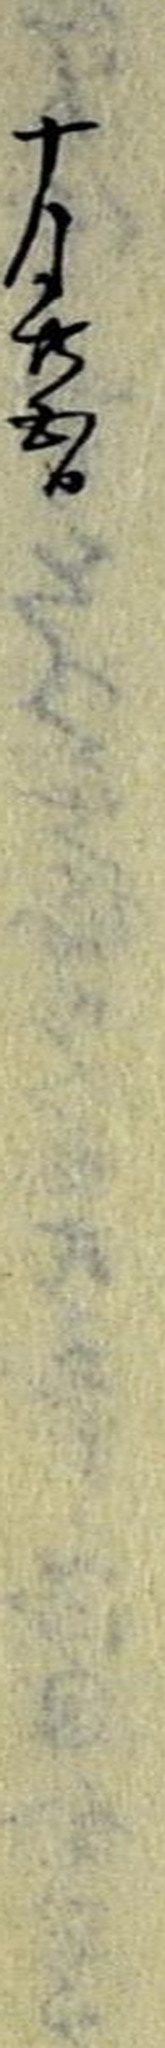十月廿五日
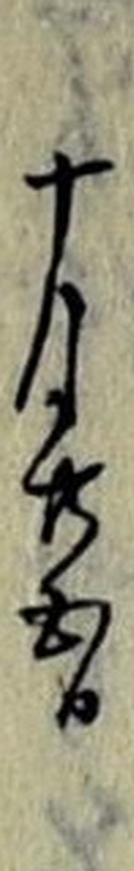十月廿五日
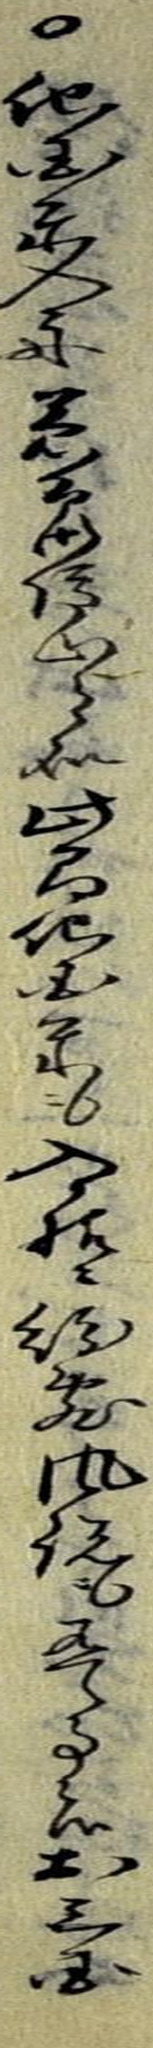〇他国米入舟兼而御停止ニ候処此間他国米も入候様ニ紛敷風説も有之事ニ候於三国
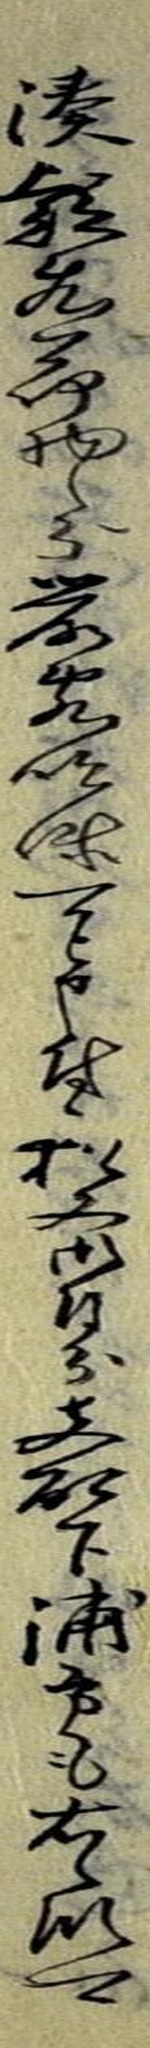湊疑敷荷物之分厳敷吟味可被申付候猶又御自分支配下浦方へも右之段可
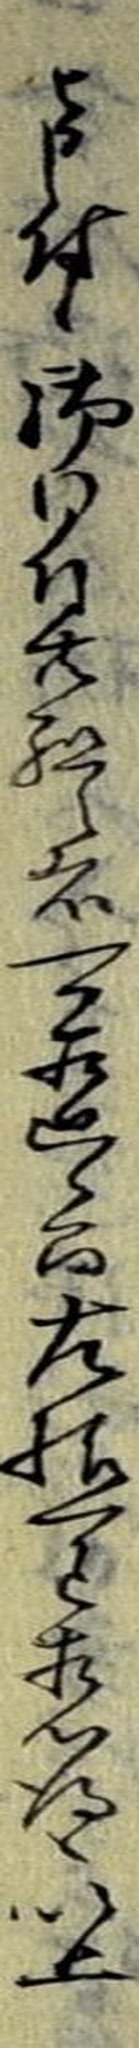被申付候御目付共組之者可相廻候間左様可被相心得候以上
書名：命令之部 一
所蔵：福井県文書館 Fukui Prefectural Archives
